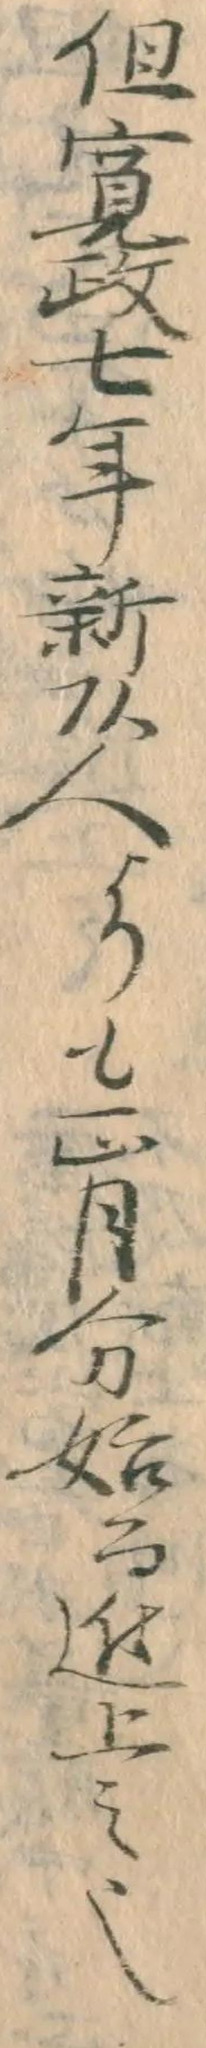但寛政七年新頭人よりも正月分始而進上之也
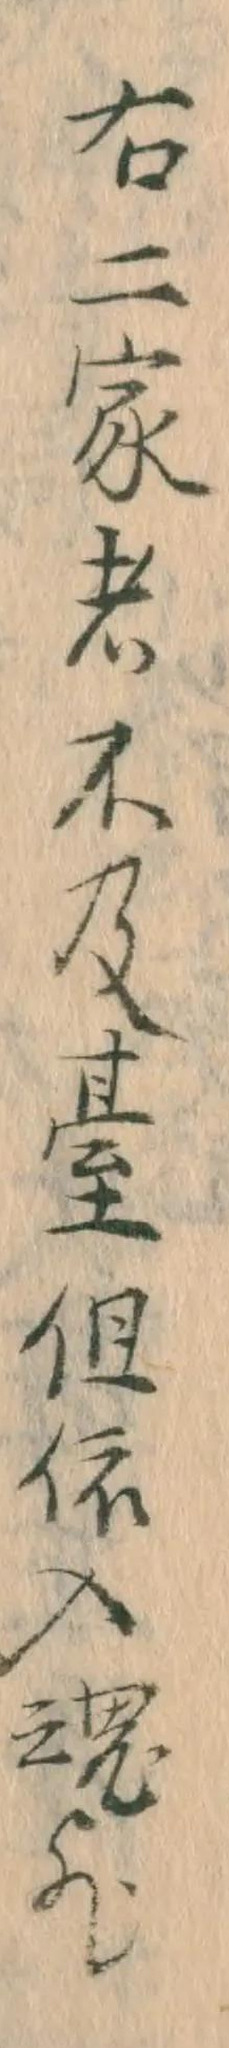右二家は不及臺但依入魂歟
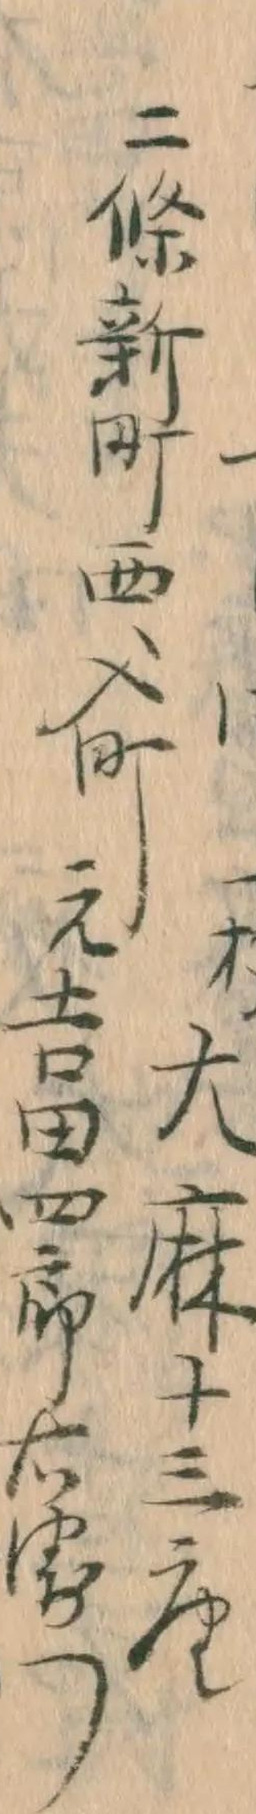二條新町西へ入町元吉田四郎右衛門
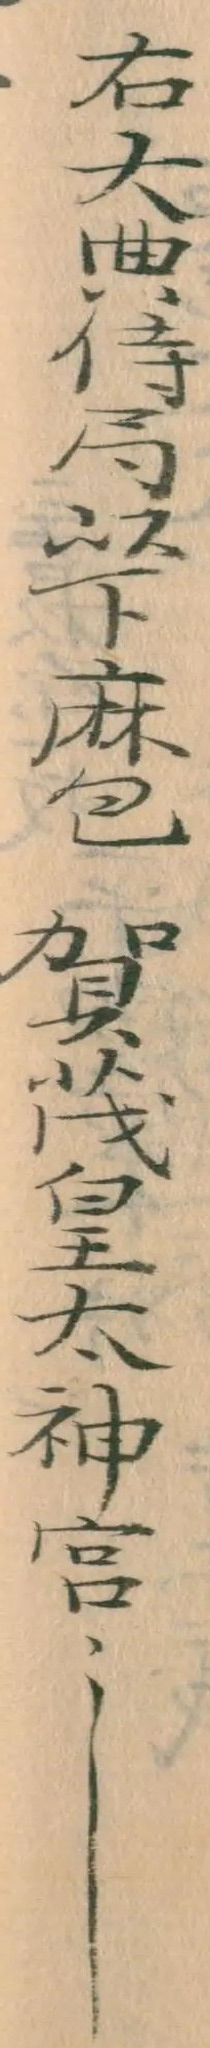右大典侍局以下麻包賀茂皇太神宮ーーー
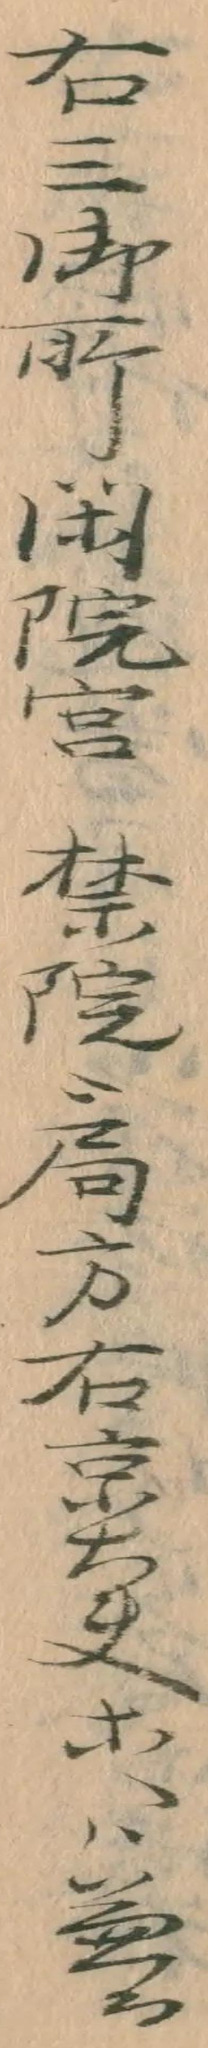右三御所閑院宮禁院御局方右京大夫等ヘハ兼而
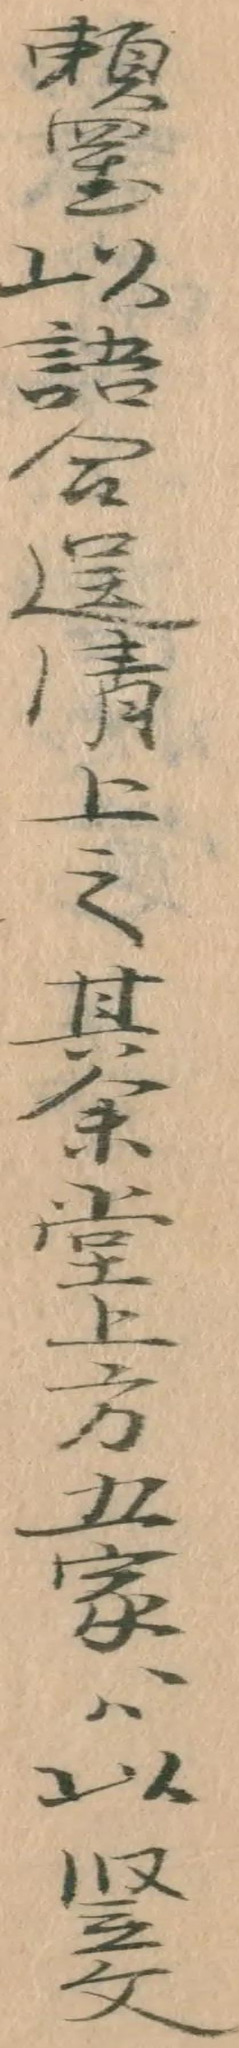頼置以語合逞清上之其余堂上方五家ヘハ以堅文
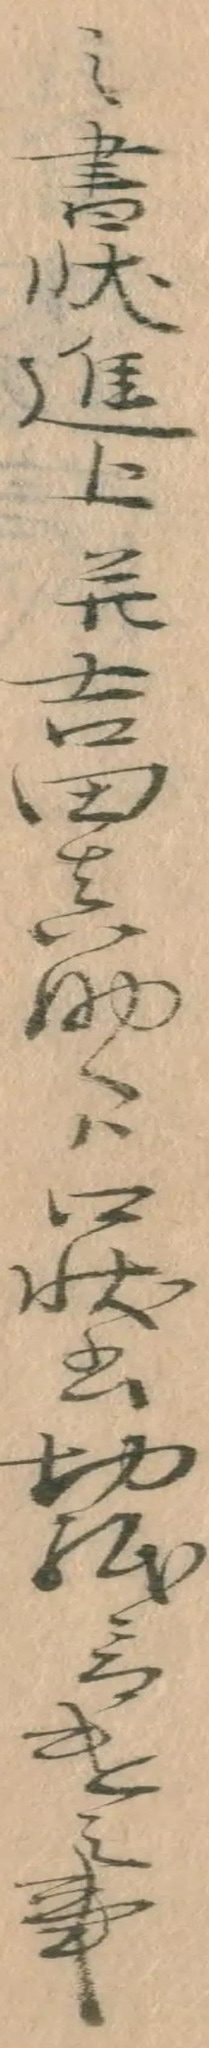之書状進上并吉田真助へハ口状書切紙ニ而遣之事
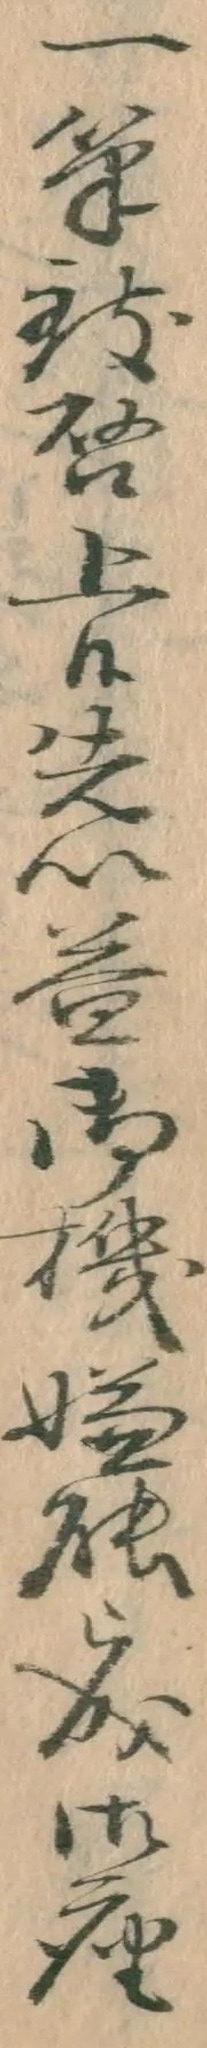一筆被啓上候先以益御機嫌能被成御座
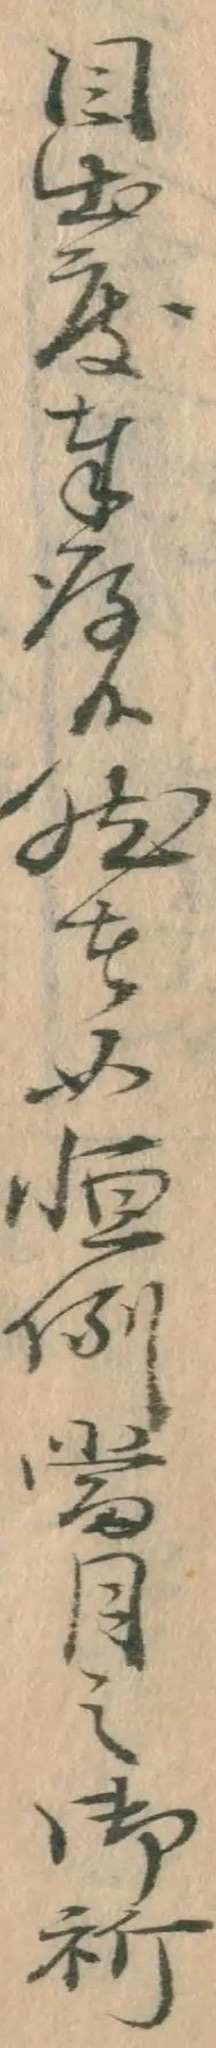目出度奉存候然者如恒例當月之御祈
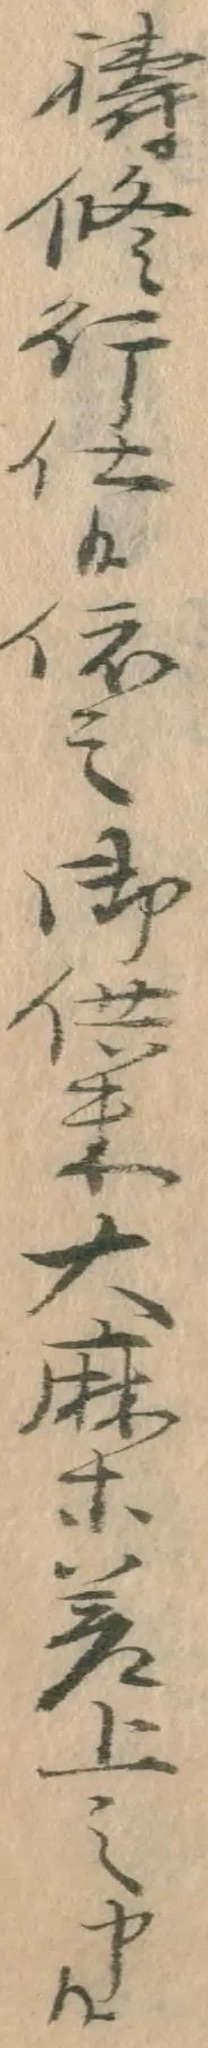祷修行仕候依之御供来大麻等差上之申候
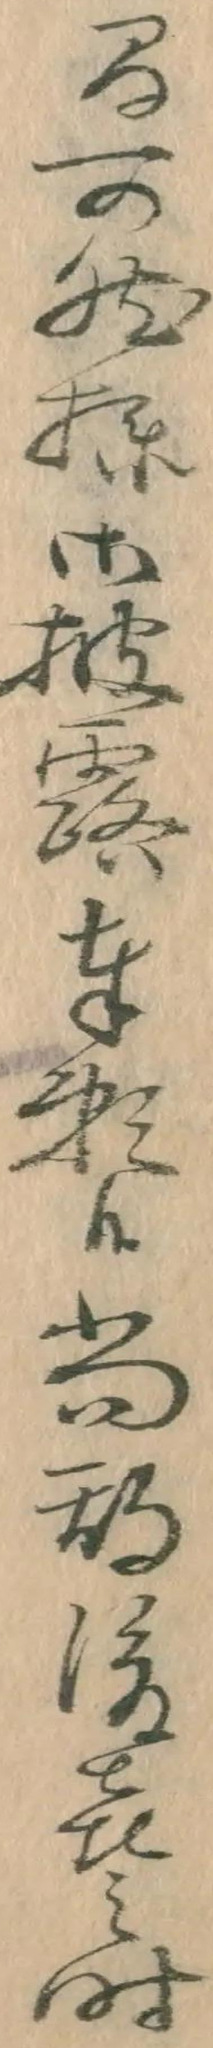間可然様御披露奉頼候尚期後喜之時

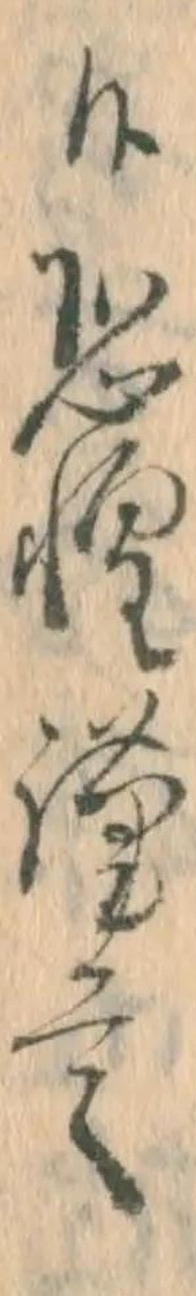候恐惶謹言
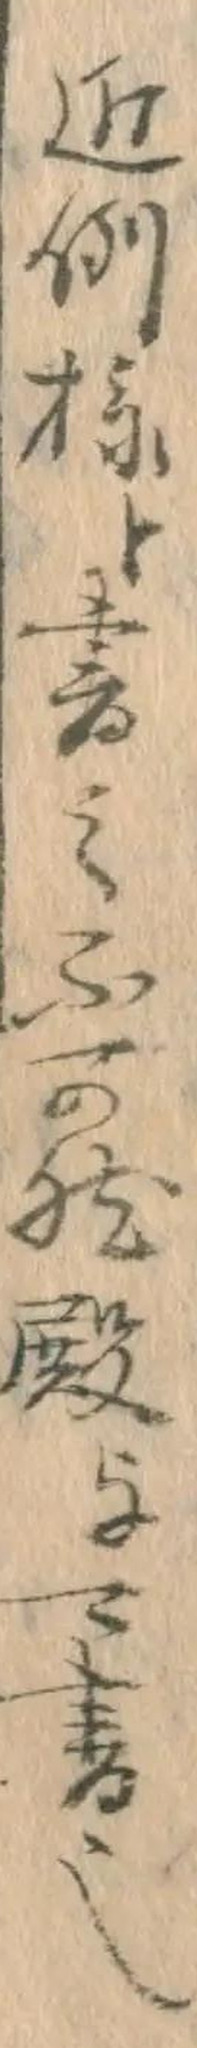近例様と書也不可然殿と可書也
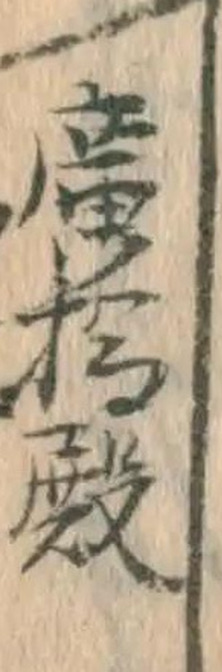廣橋殿
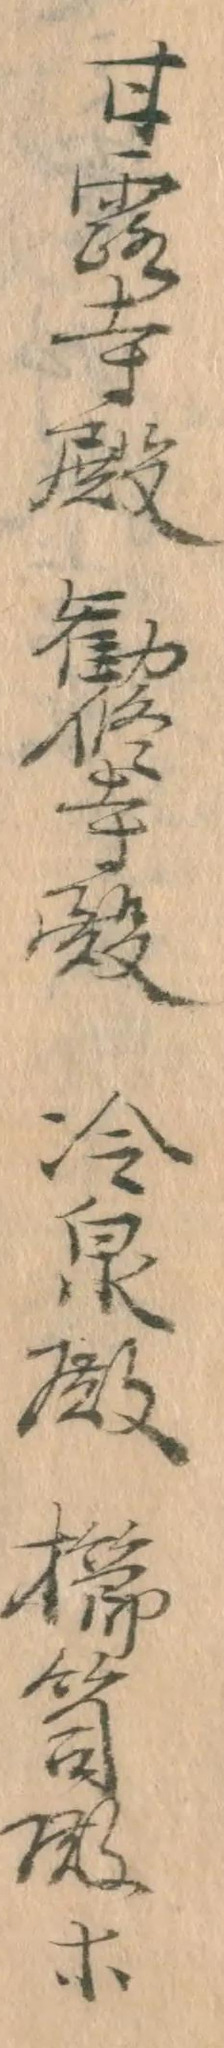甘露寺殿勧修寺殿冷泉殿櫛笥殿等
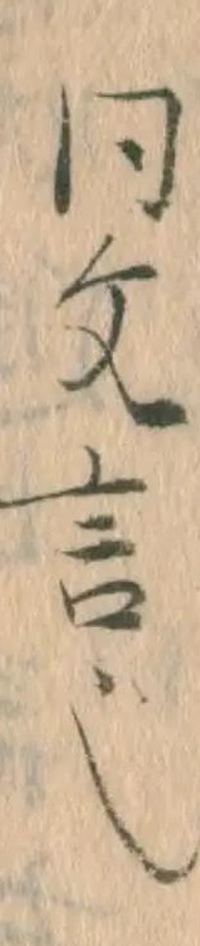同文言也
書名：賀茂社記録. 第72冊
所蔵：国立国会図書館 National Diet Library, JAPAN
